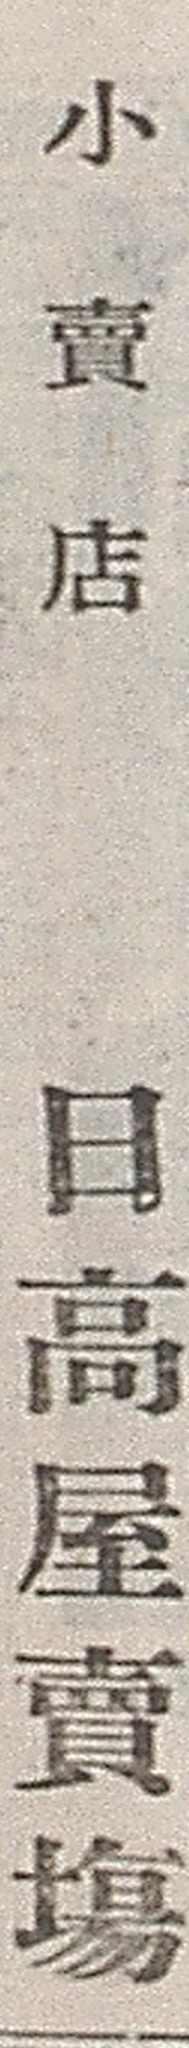小売店日高屋売場
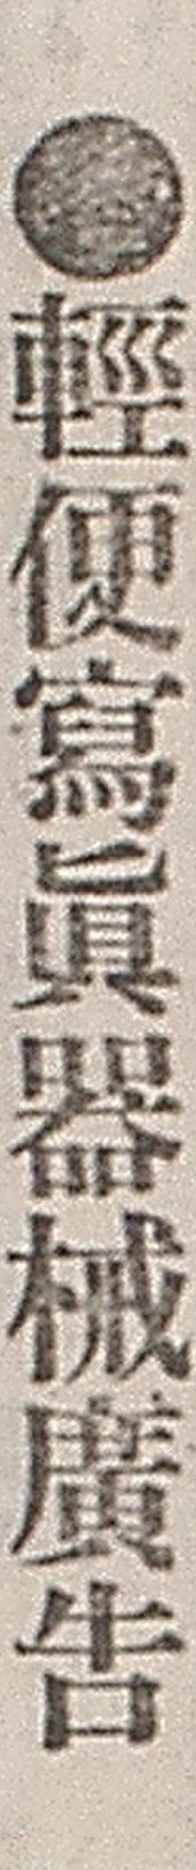●軽便写真器械広告
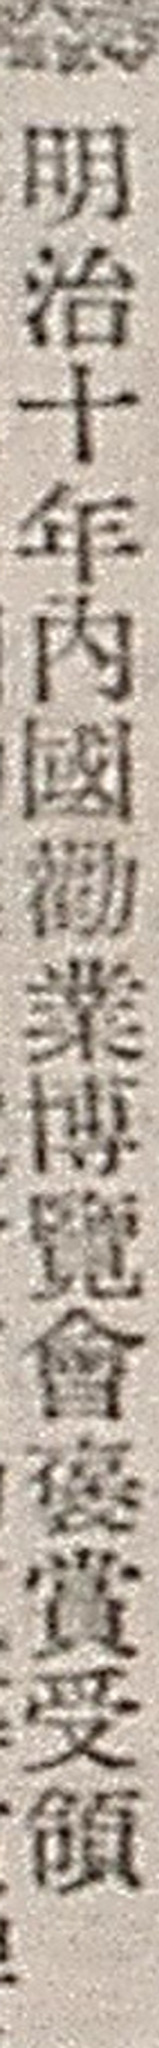明治十年内国勧業博覧会褒賞受領
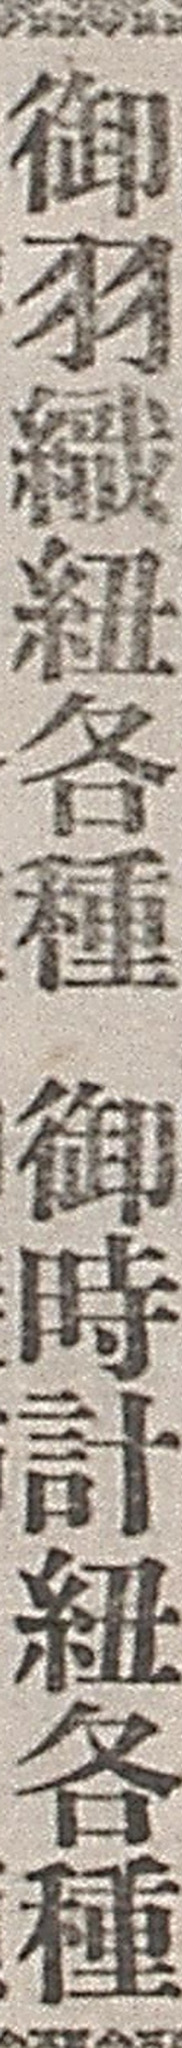御羽織紐各種御時計紐各種
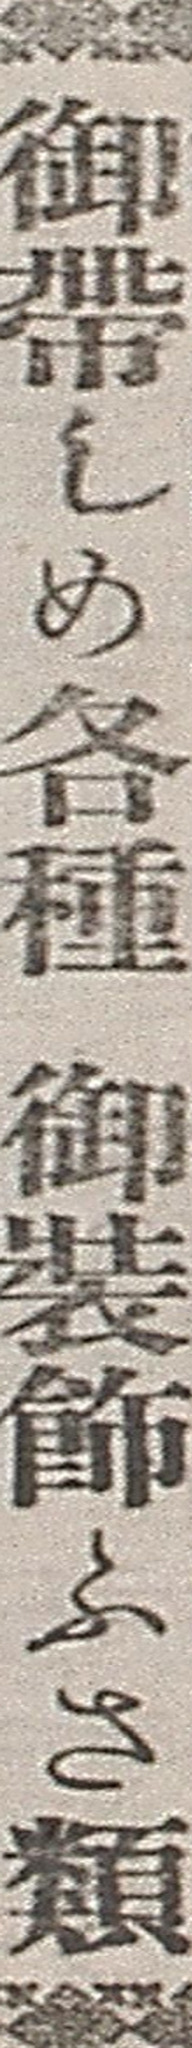御帯しめ各種御装飾ふさ類
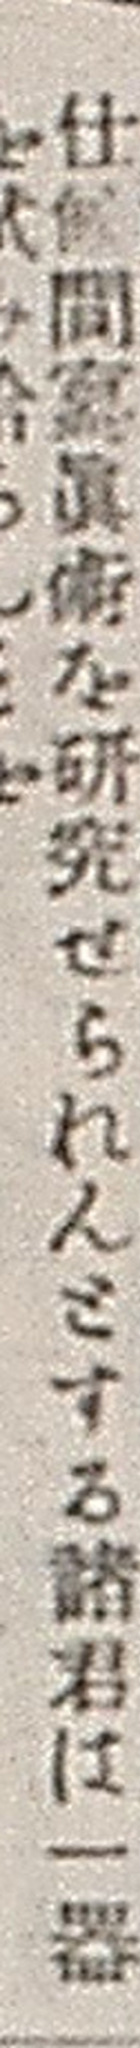仕候間写真術を研究せられんとする諸君は一器
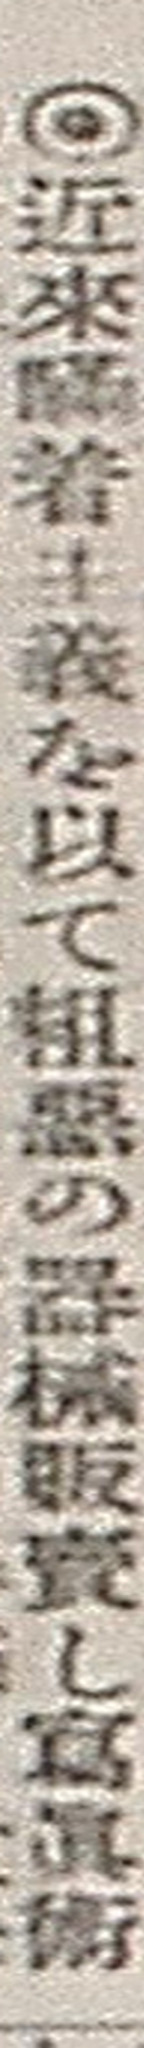⦿近来瞞着主義を以て粗悪の器械販売し写真術
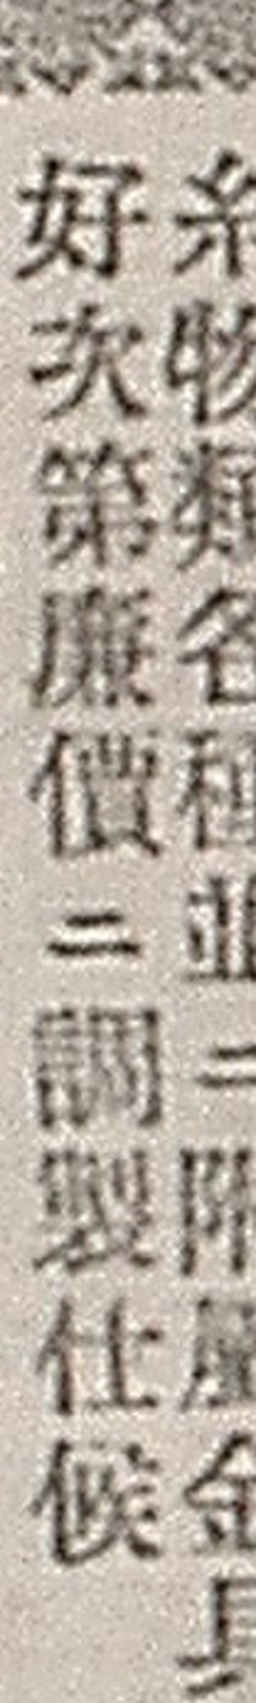好次第廉価ニ調製仕候
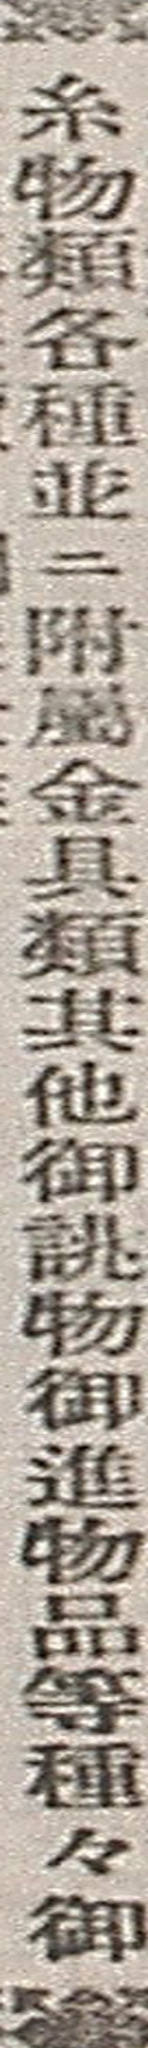糸物類各種並ニ附属金具類其他御誂物御進物等種々御
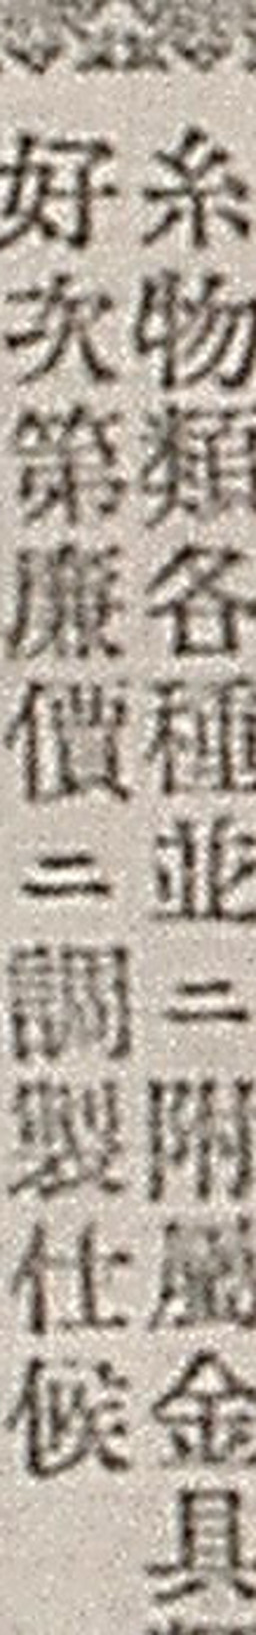好次第廉価ニ調製仕候
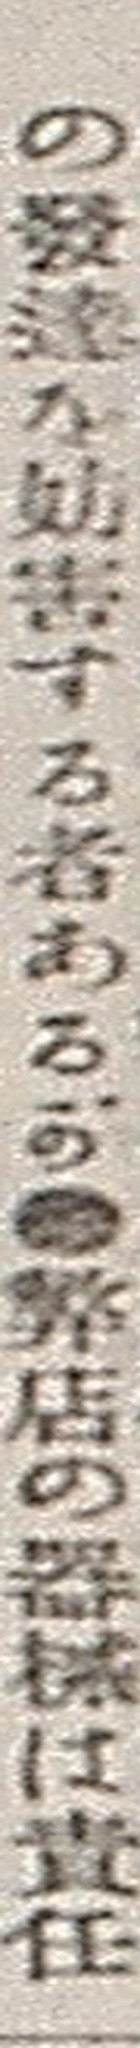の発達を妨害する者あるが●弊店の器械は責任
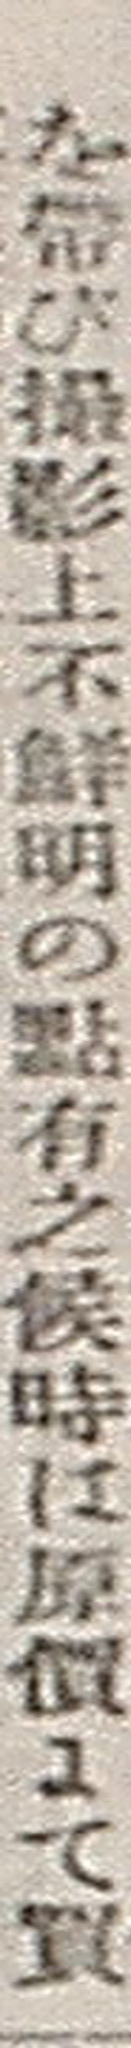を帯び撮影上不鮮明の点有之候時は原価にて買
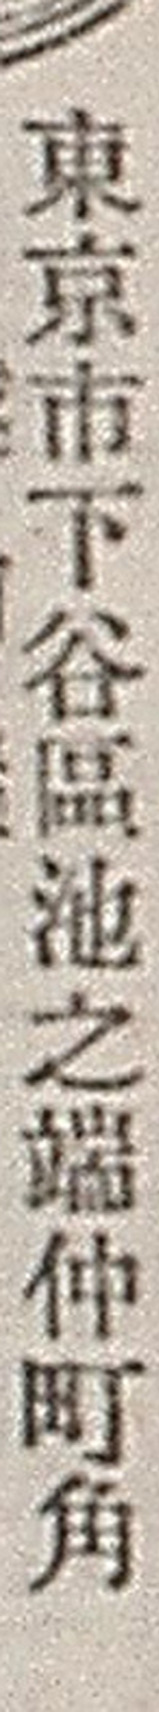東京市下谷区池之端仲町角
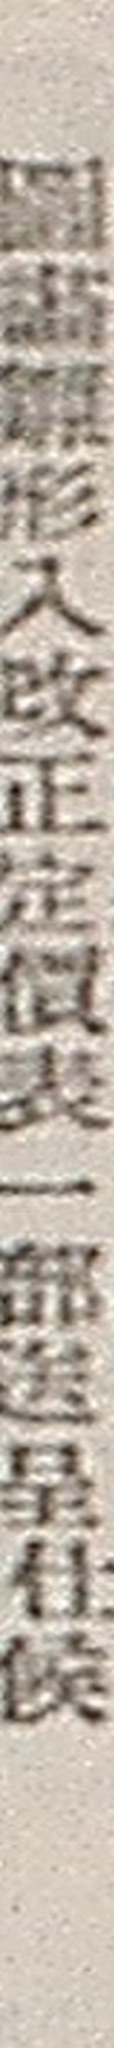図画雛形入改正定価表一部送呈仕候
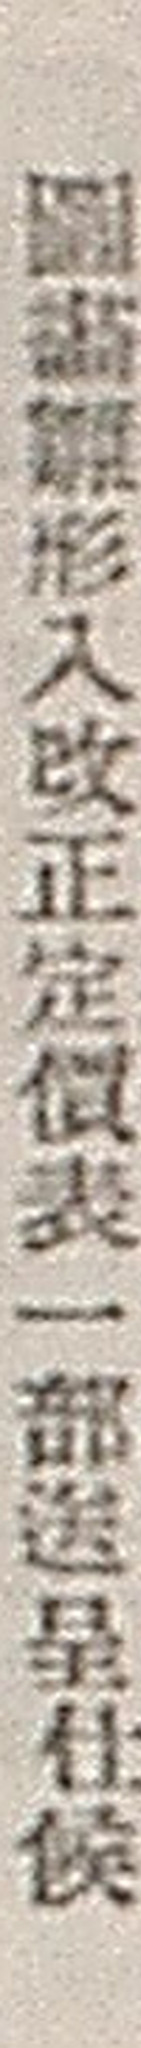図画雛形入改正定価表一部送呈仕候
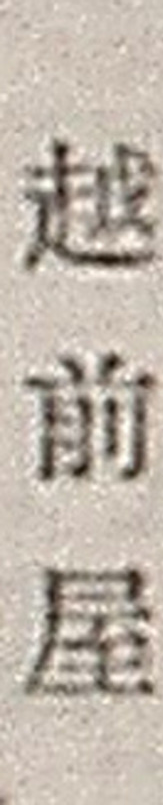越前谷
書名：風俗畫報臨時増刊第百二十四號　洪水地震被害録（上）
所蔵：東京大学地震研究所図書室 Earthquake Research Institute Library, The University of Tokyo, JAPAN
